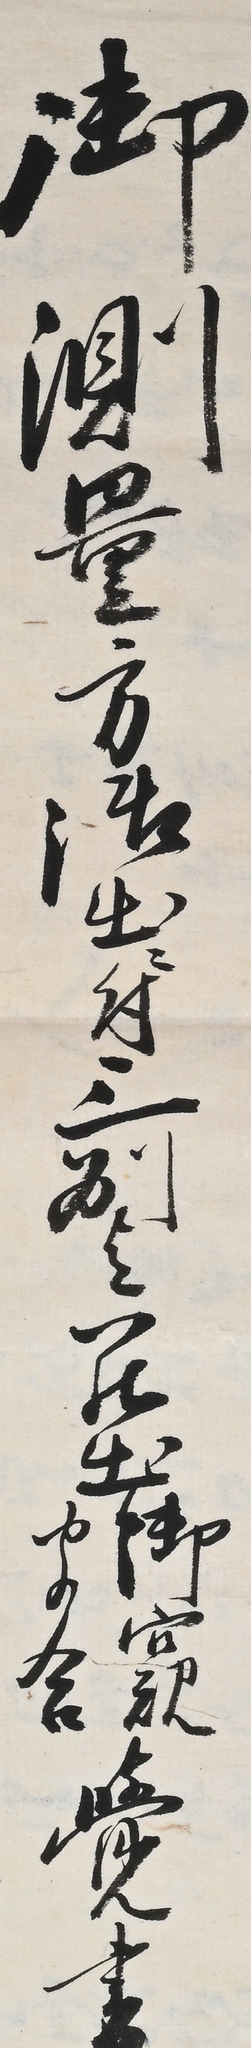御測量方御出ニ付三州迄罷出御窺聞合覚書

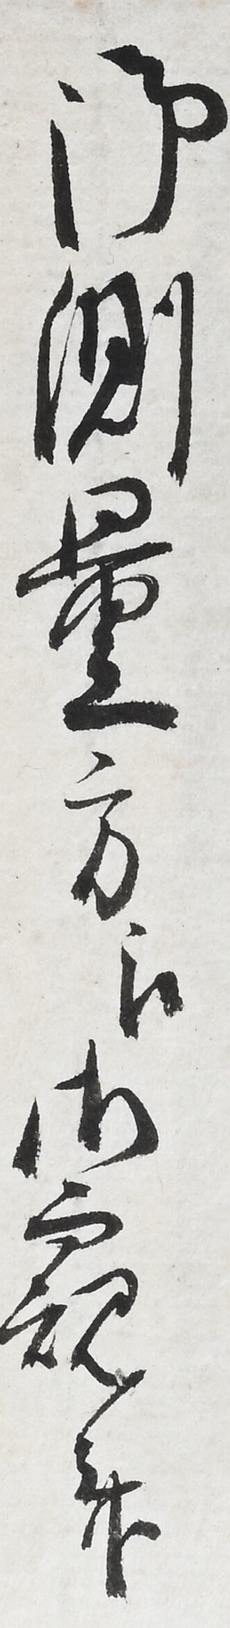御測量方え御窺幷
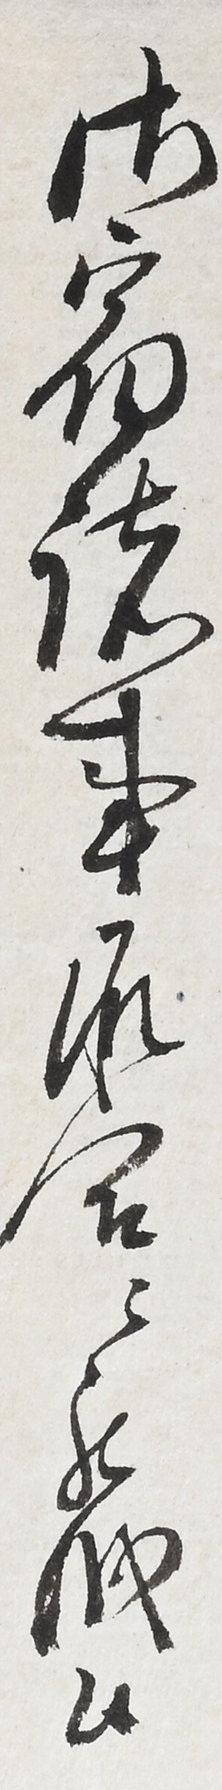御宿諸事承合ニ罷越候
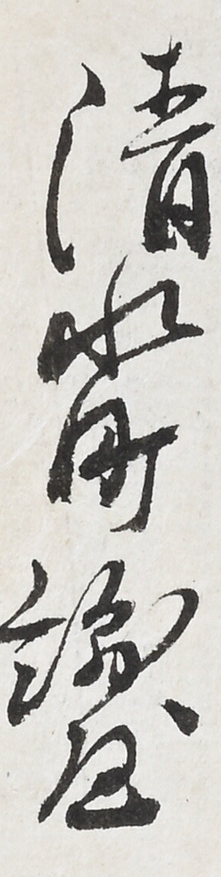清水町綿屋
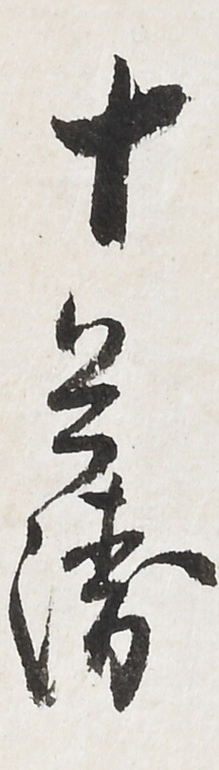十兵衛
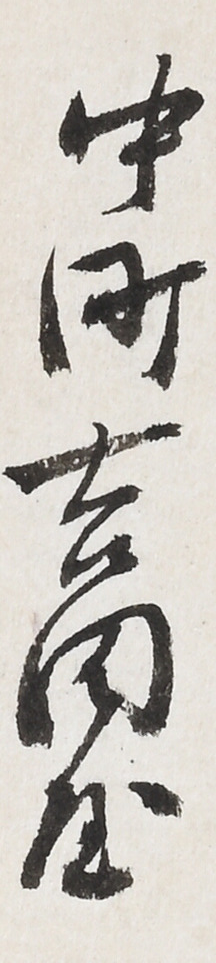中町吉田屋
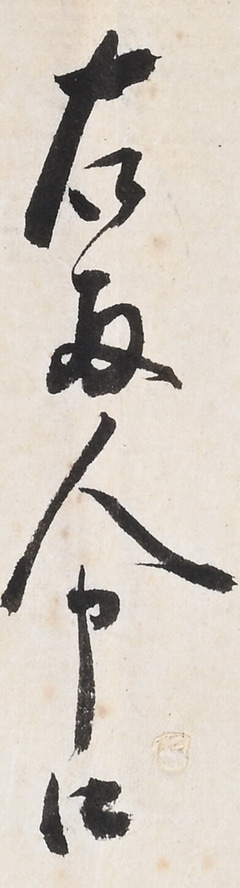右両人中え
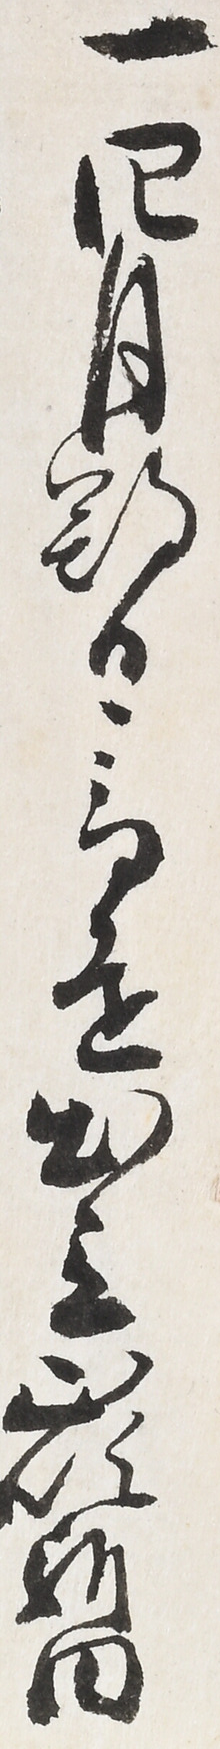一四月朔日高遠出立山吹新田
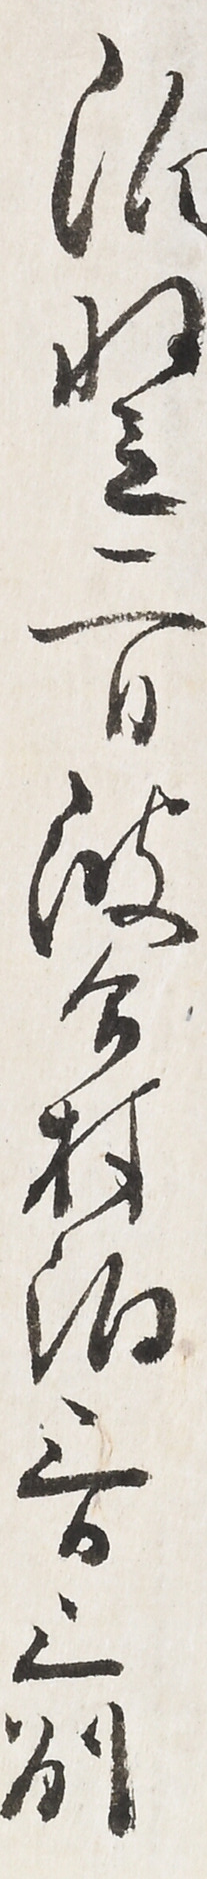泊翌二日波合村泊三日三州
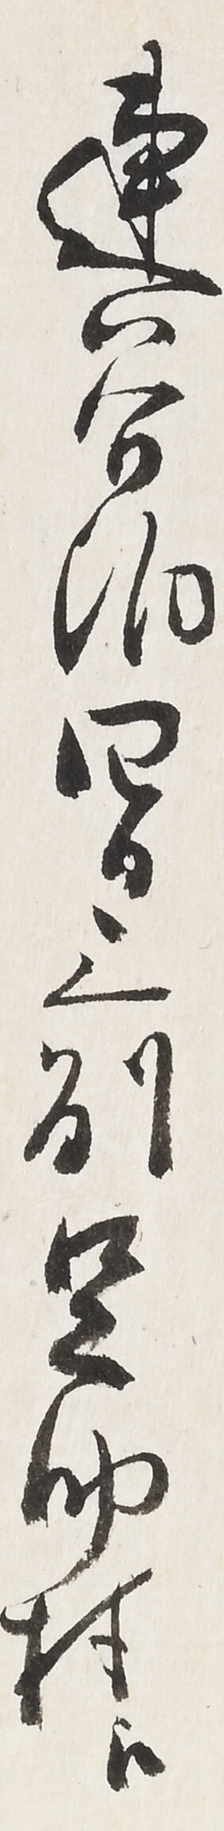連谷泊四日三州足助村え
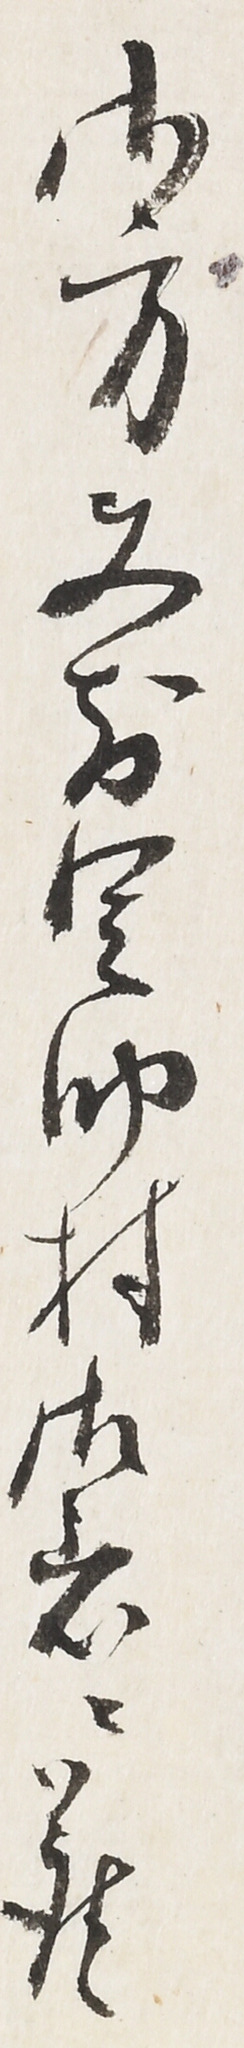御方夫前足助村御着ニ御座候
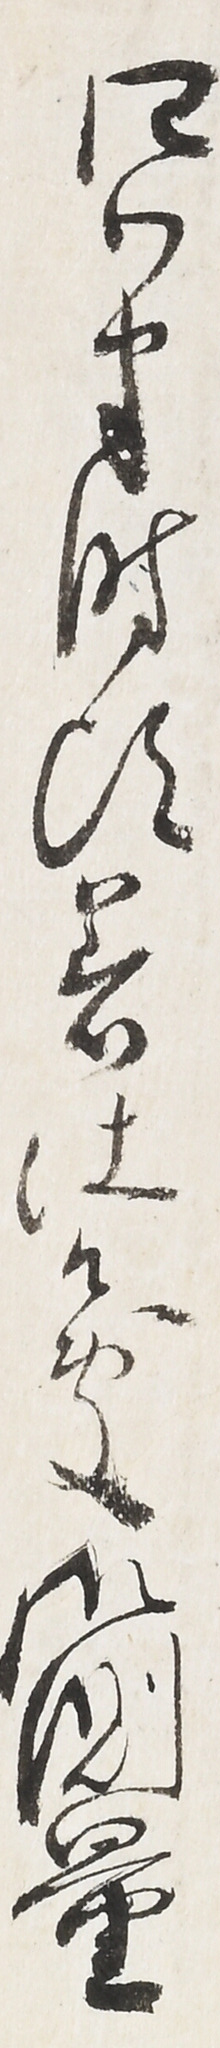四ツ半時頃着仕候処御測量
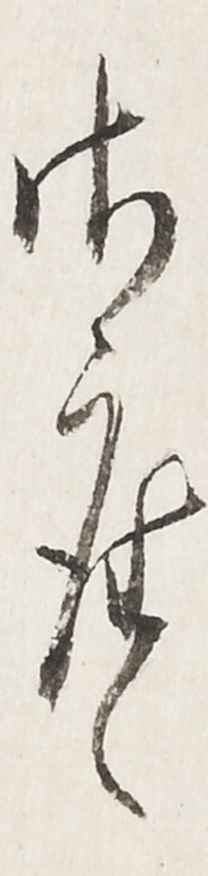御座候
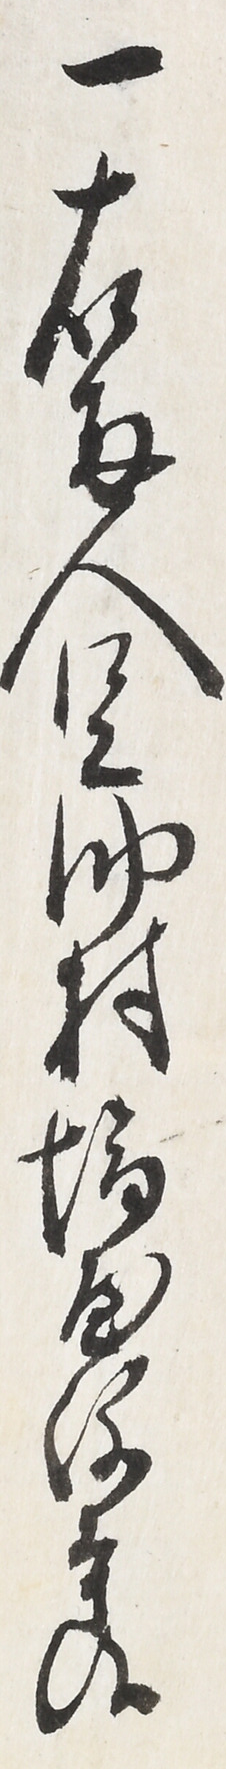一右両人足助村塩屋弥平治
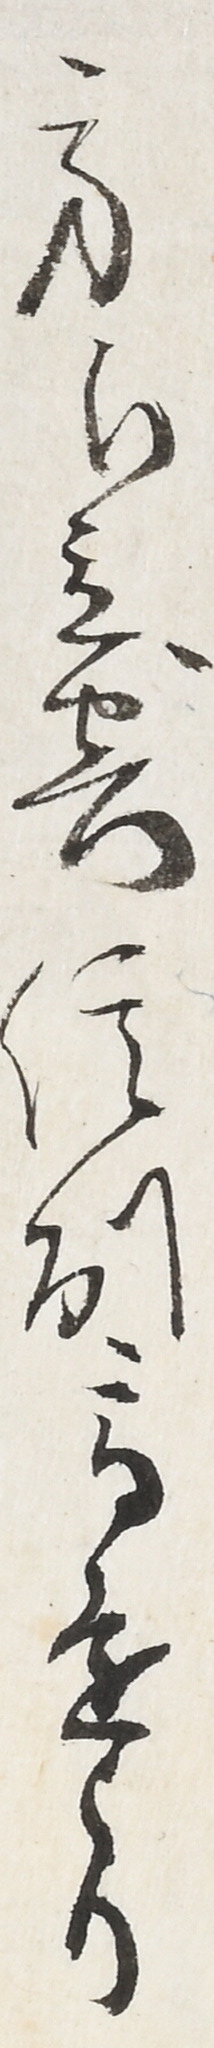方え立寄信州高遠より

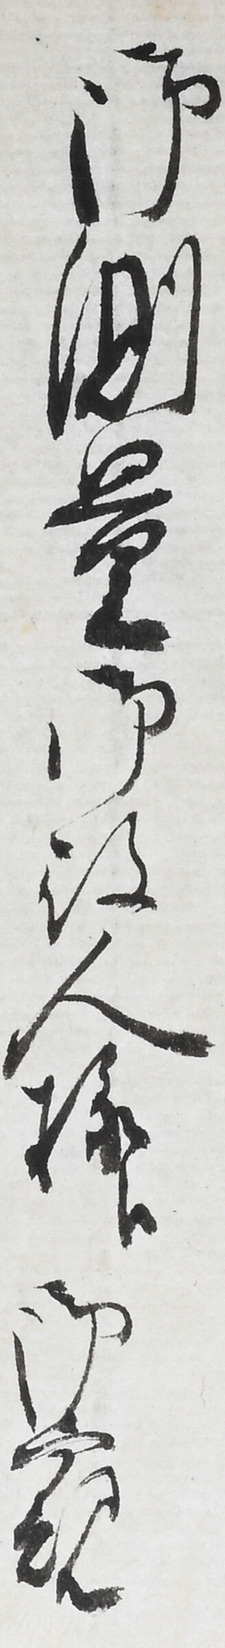御測量御役人様え御窺
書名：御測量方御出ニ付三州迄罷出御窺聞合覚書
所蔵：伊那市立高遠町図書館・合同会社AMANE
